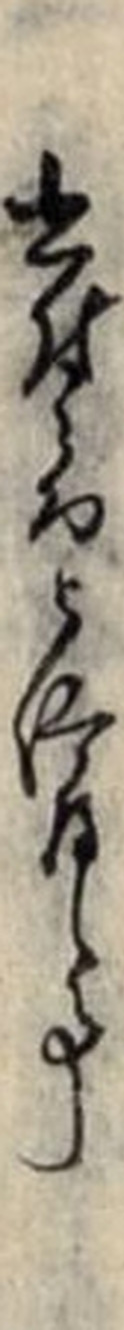書付に而被仰付候事
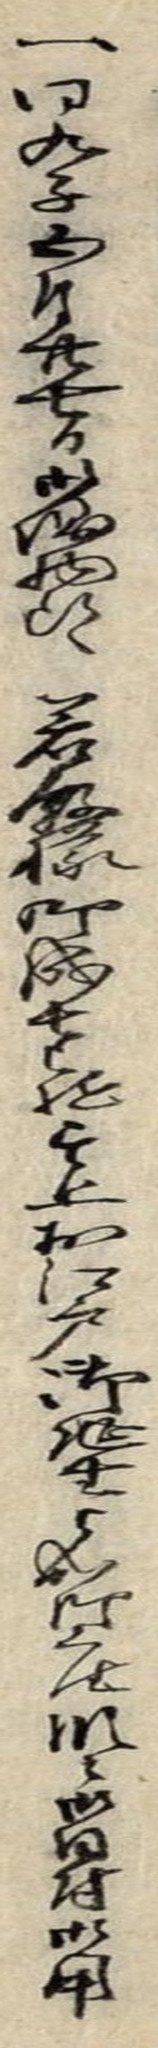一同九子五月廿七日御側物頭へ若殿様御成長被遊其上於江戸御誕生被成御座段々御目付御用
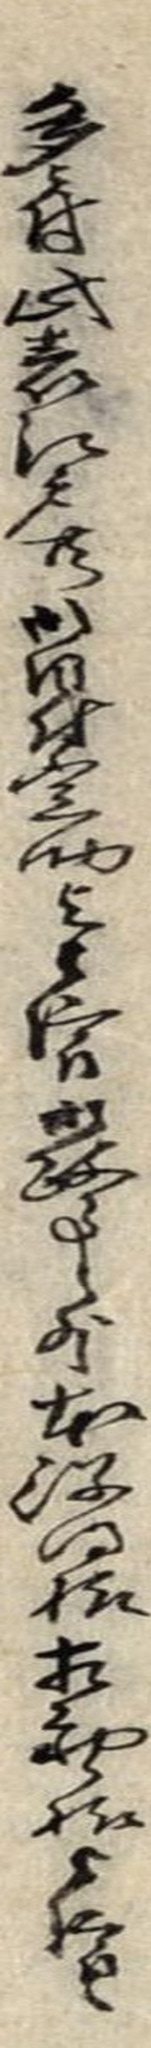多に付此表江戸共御目付定助と被仰付御政事之外本役同様相勤候様被仰付候
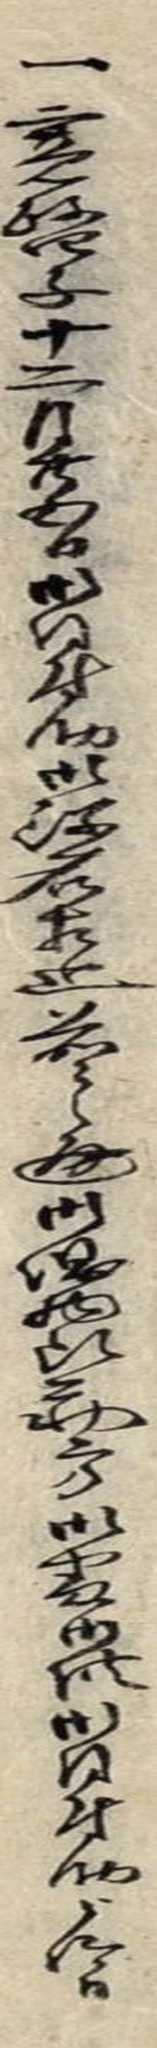一寛政四子十二月廿五日御目付助御役名相止前々之通御側物頭勤方御番御供御目付助被仰付
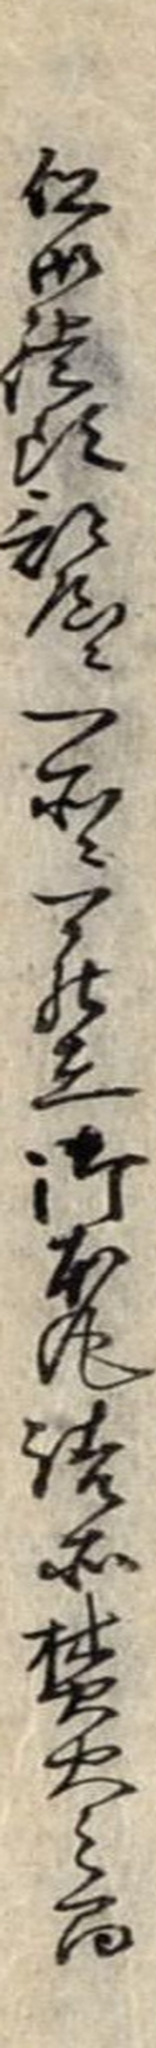但御徒頭部屋に一所に可罷在御本丸詰所焚火之間
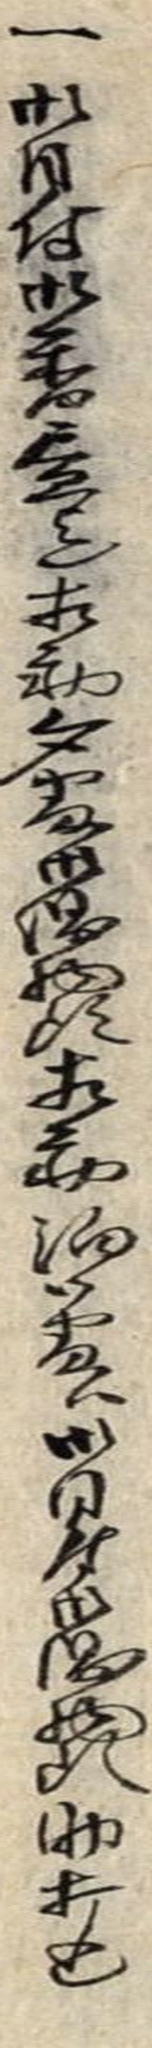一御目付御番昼迄相勤夕番御側物頭相勤泊御番は御目付御側物頭助打込
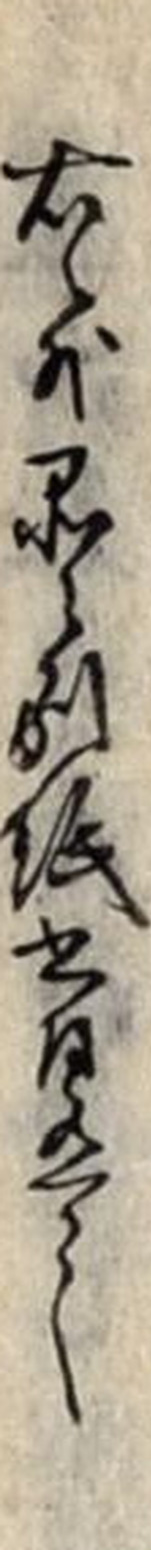右之外品々別紙書付有之
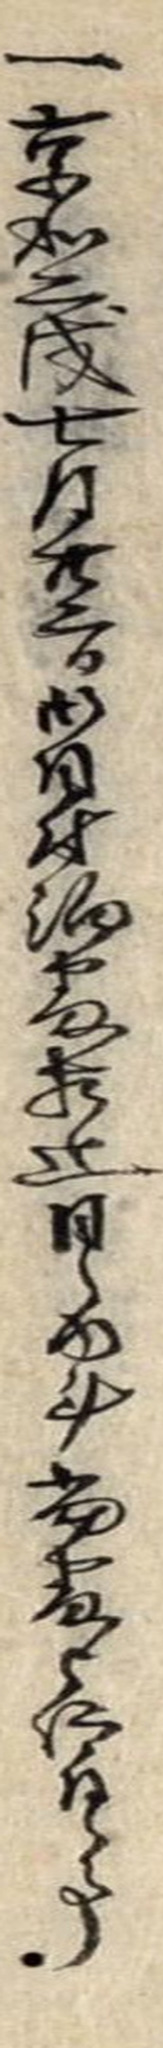一享和二戌七月廿二日御目付泊番相止日之内斗当番被仰付候事
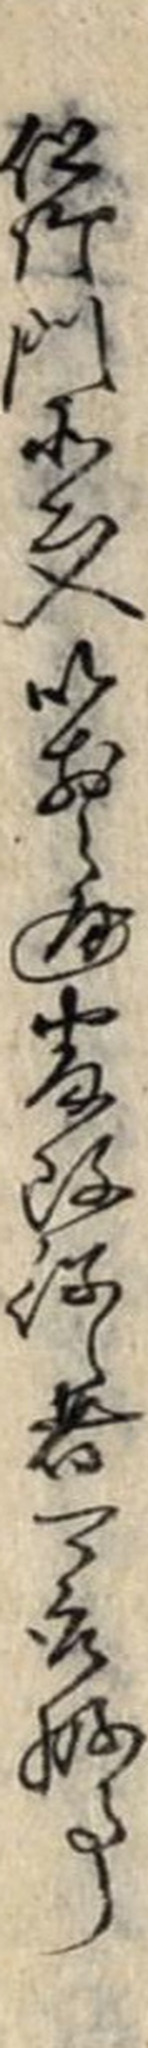但御門所出入以前之通番改役之者可取扱事
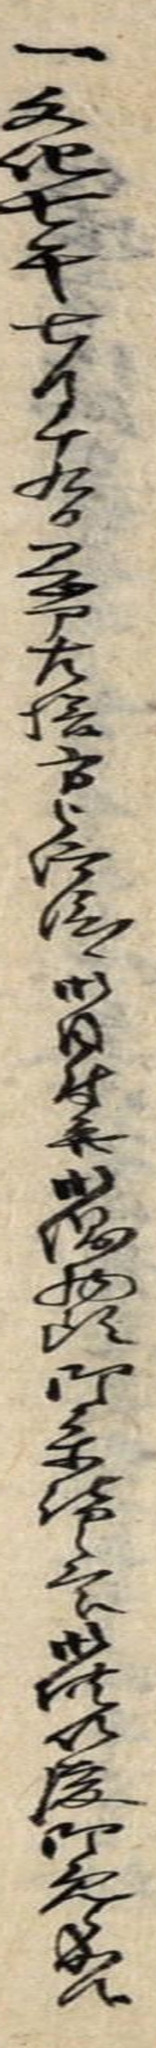一文化七午七月十九日岡部左膳方被仰渡候御目付并御側物頭御参詣之節御供以後御免被成候

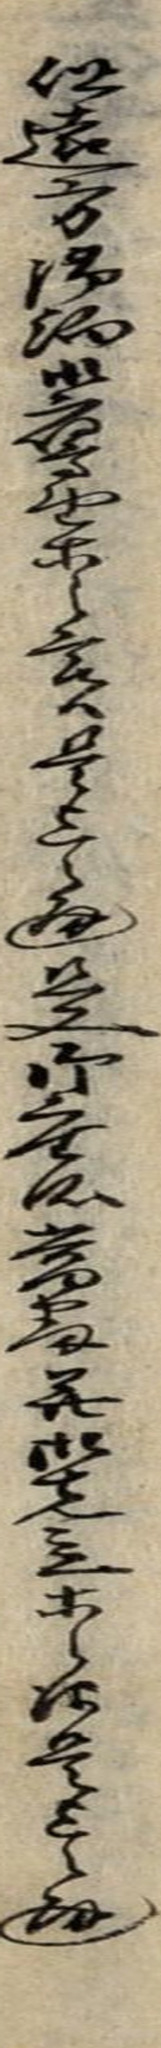但遠方御泊御鷹野等之節は是迄之通且又御座所当番并御先立等之儀是迄之通
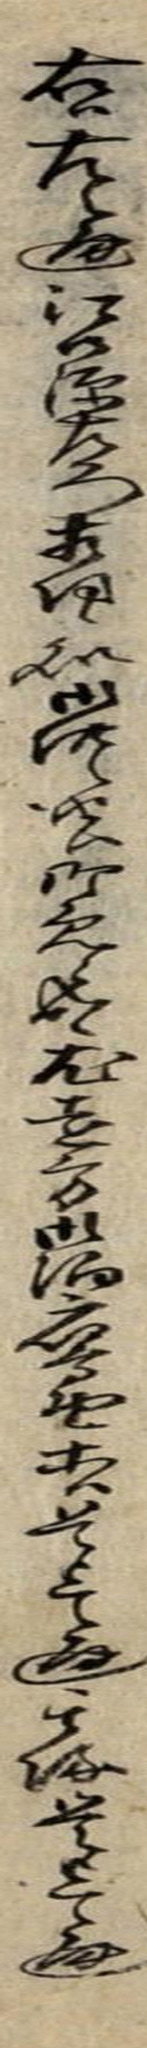右左之通江口源左衛門相伺候処御供之儀は御免被成候尤遠方御泊鷹野等は是迄之通其帰是迄之通
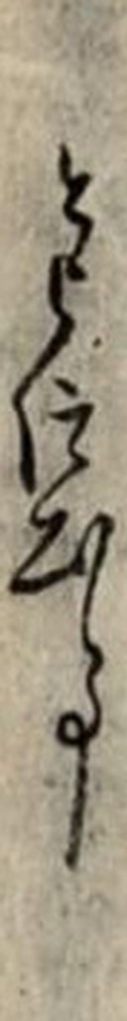と被仰出候事
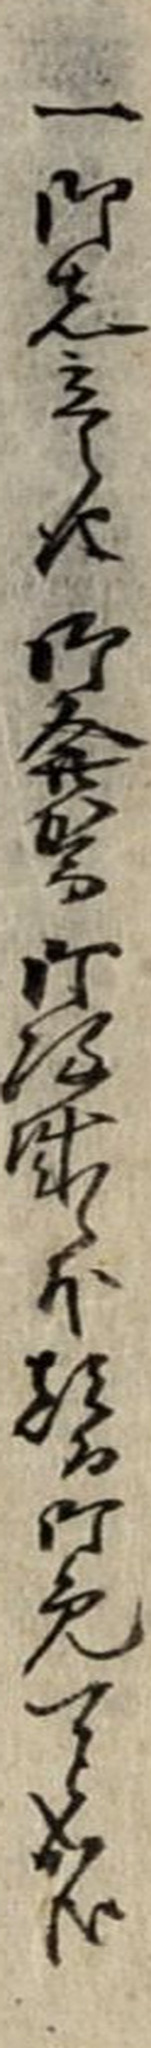一御先立之儀御発駕御帰城之外都而御免可被成哉
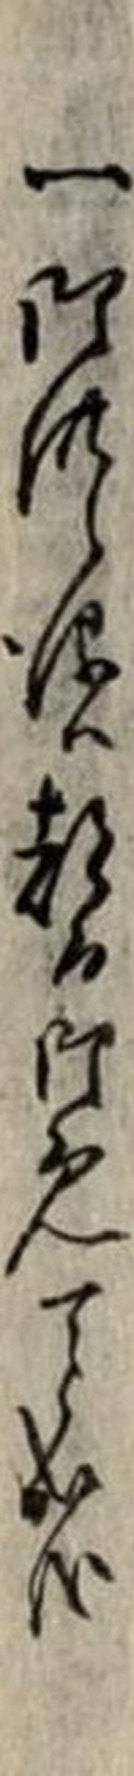一御供之儀は都而御免可被成哉
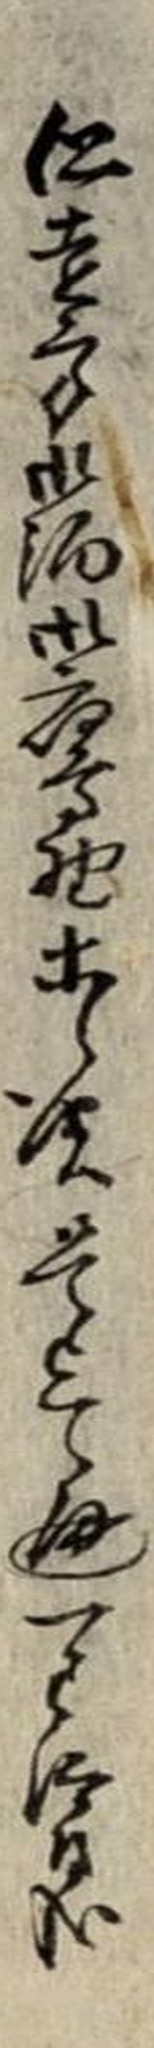但遠方御泊御鷹野等之儀は是迄之通可被仰付哉
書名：蒐輯之部
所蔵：福井県文書館 Fukui Prefectural Archives
